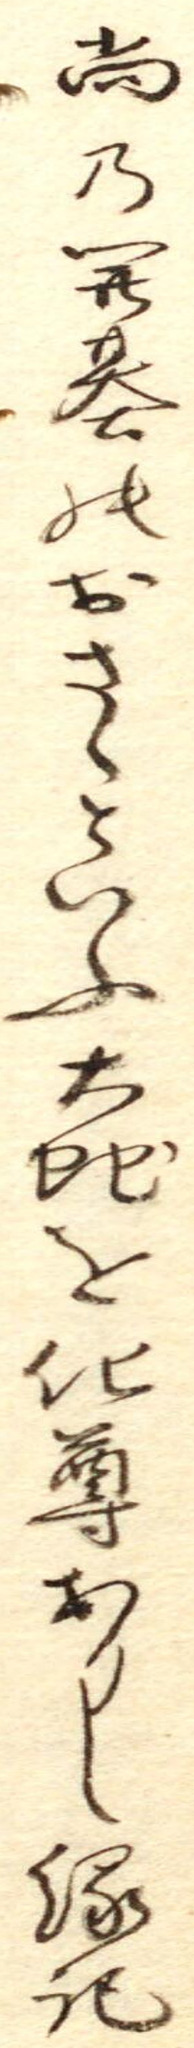尚の開基のおさくといふ大蛇を化尊ありし縁起
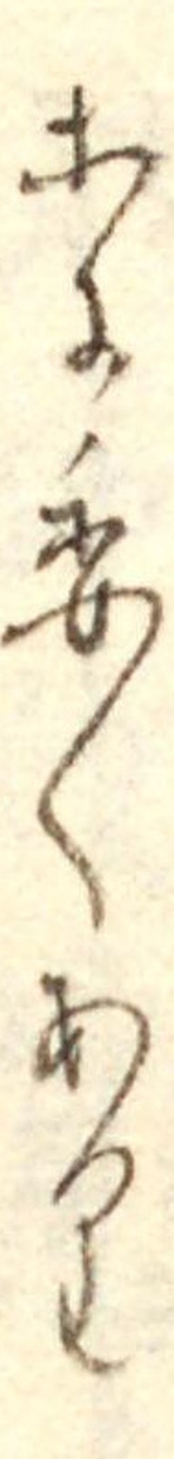等に委くあり
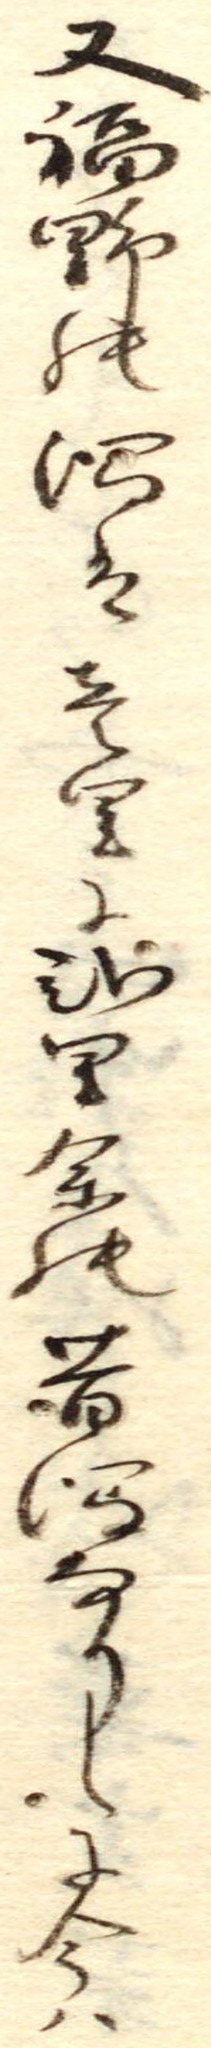又福野の潟は壱里に弐里余の昔潟なりしに今は
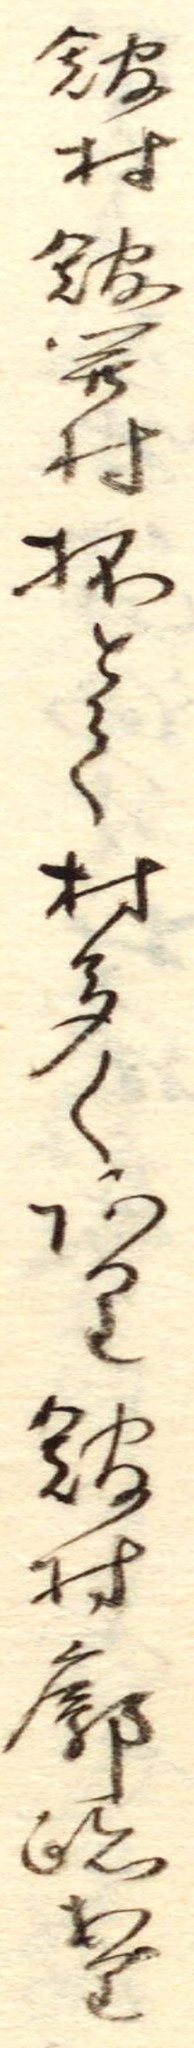館村館開村抔とて村多くあり館村廓跡あり
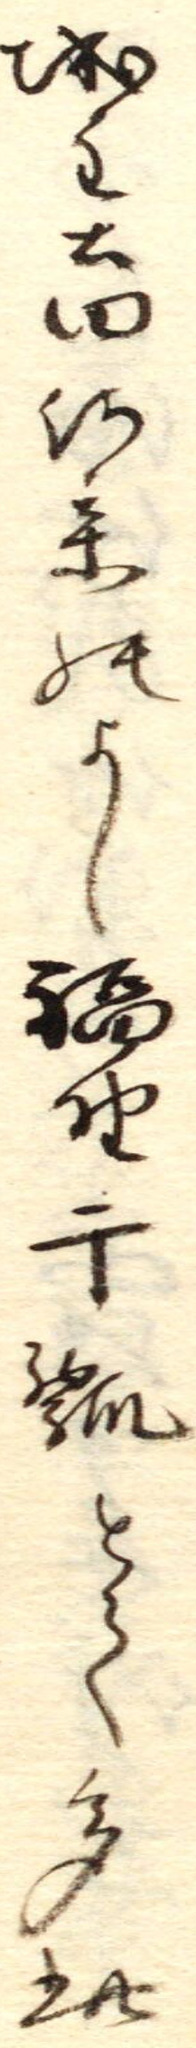城主土田何某のよし福野干瓢とて多此
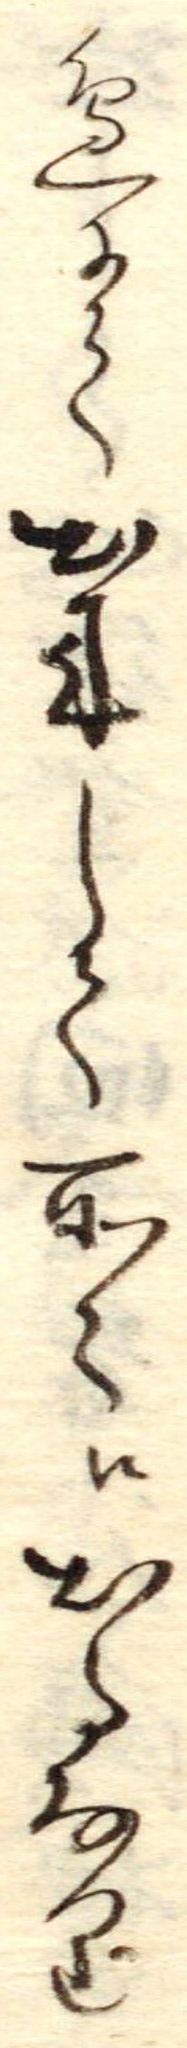辺にて出来して所々え出るなり
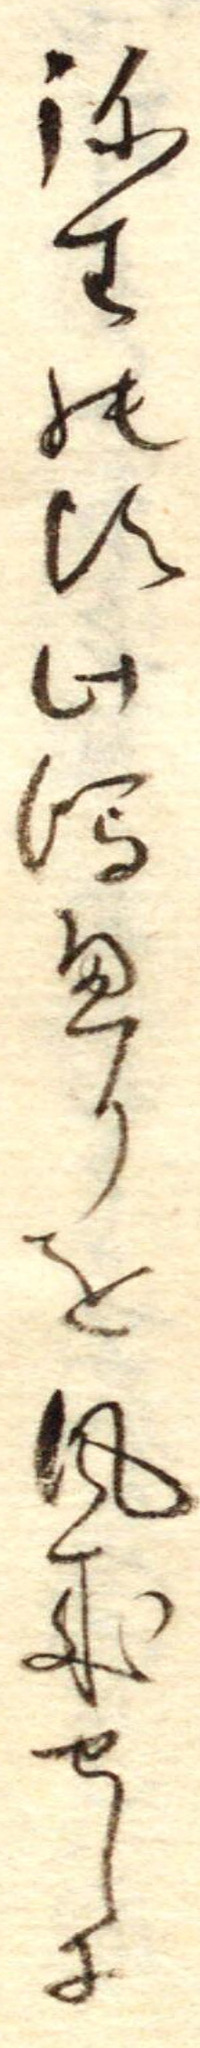弥生の頃此潟辺りをふ風来せしに
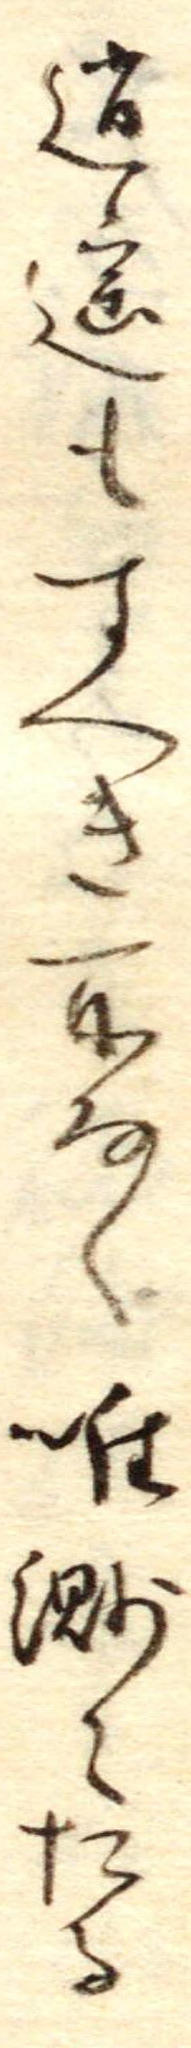逍遥もすへき所なく唯渺々たる

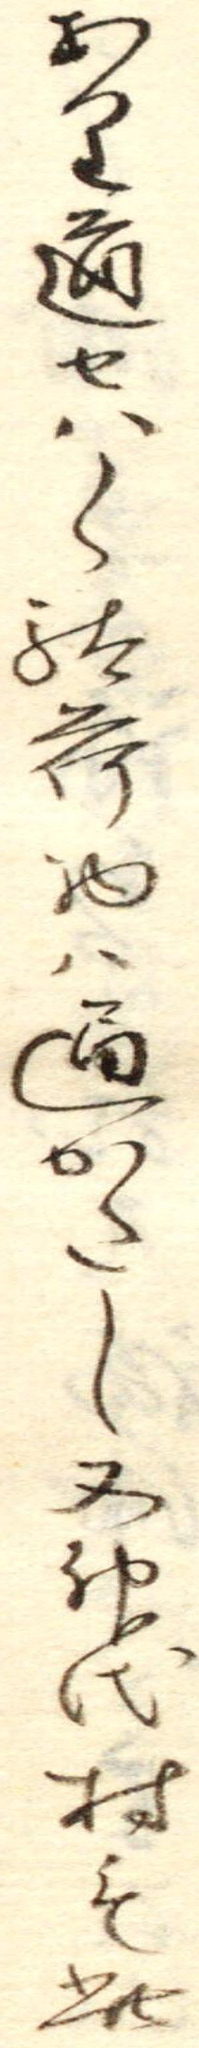あり道せはく駄荷物は通かたし又神代村も此
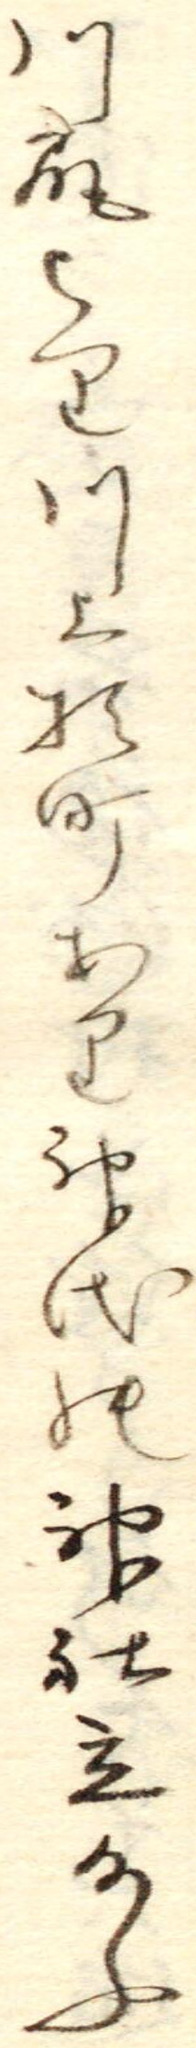川尻より川上拾町あり神代の神社立給ふ
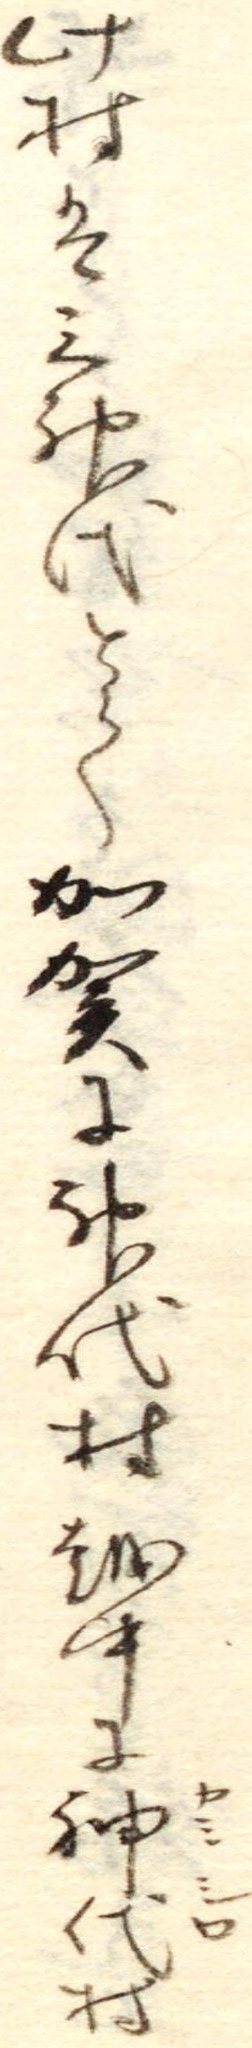此村は三神代とて加賀に神代村越中に神代村
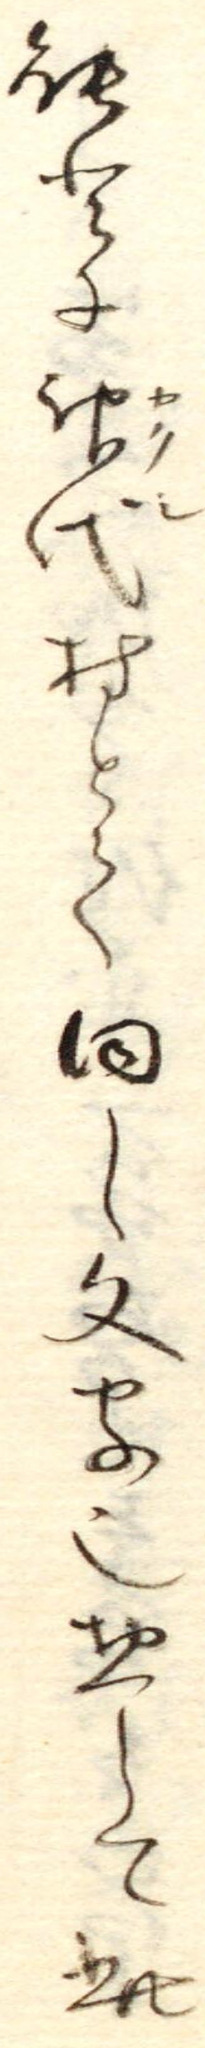能登に神代村とて同し文字也惣して此
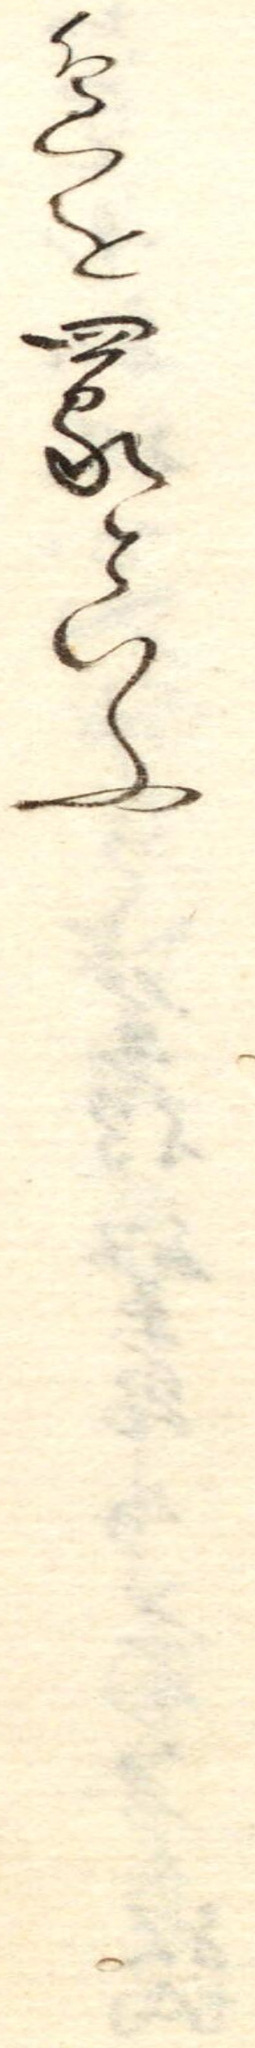辺を四家といふ
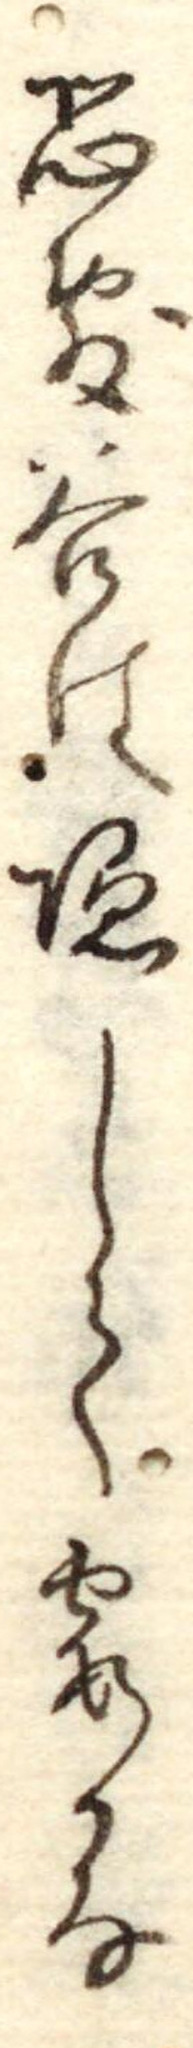恐敷谷は隠して霞かな
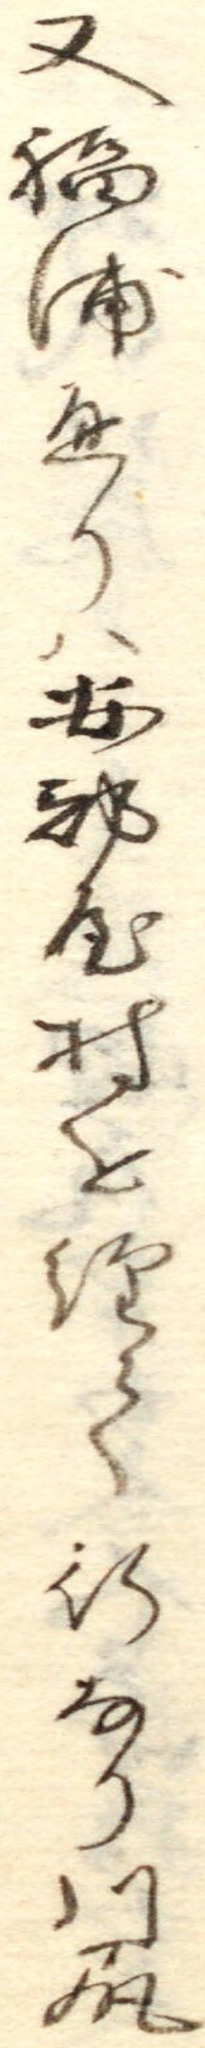又福浦通りは安部屋村経て行なり川尻
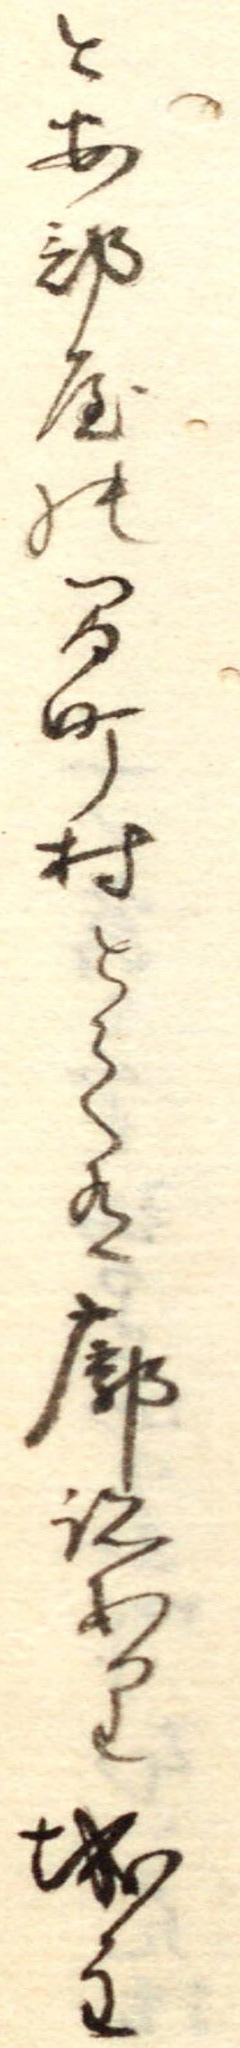と安部屋の間町村とて有廓跡あり城主
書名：能登名跡誌
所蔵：Ishikawa Prefectural Library
